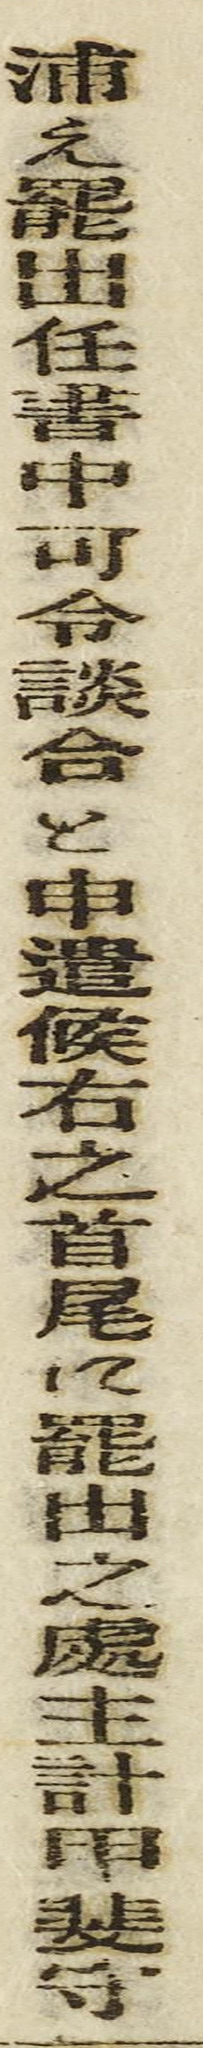浦え罷出任書中可令談合と申遣候右之首尾に罷出之処主計甲斐守
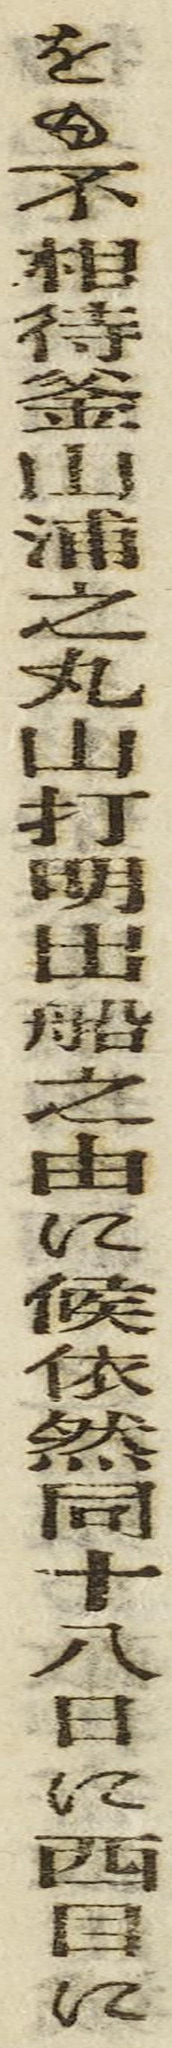をも不相待釜山浦之丸山打明出船之由に候依然同十八日に西目に
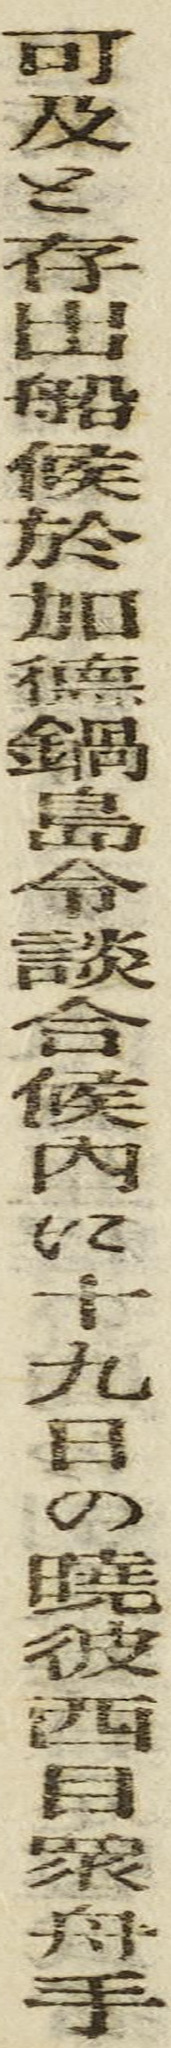可及と存出船候於加徳鍋島令談合候内に十九日の暁彼西目衆舟手
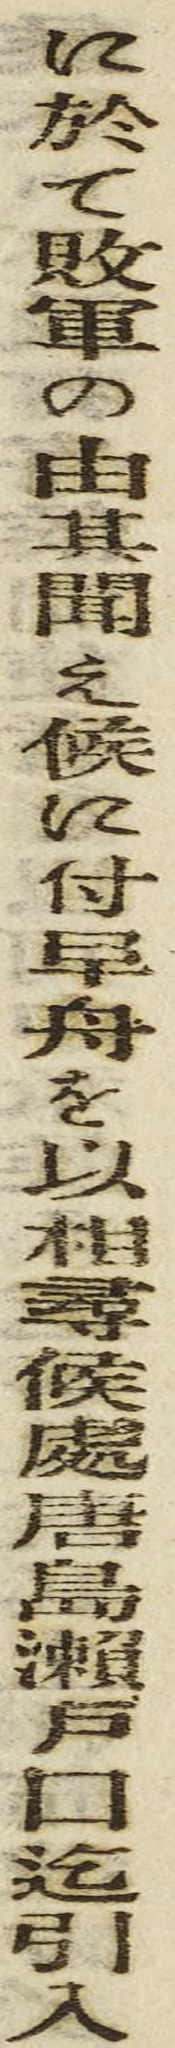に於て敗軍の由其聞え候に付早舟を以相尋候処唐島瀬戸口迄引入
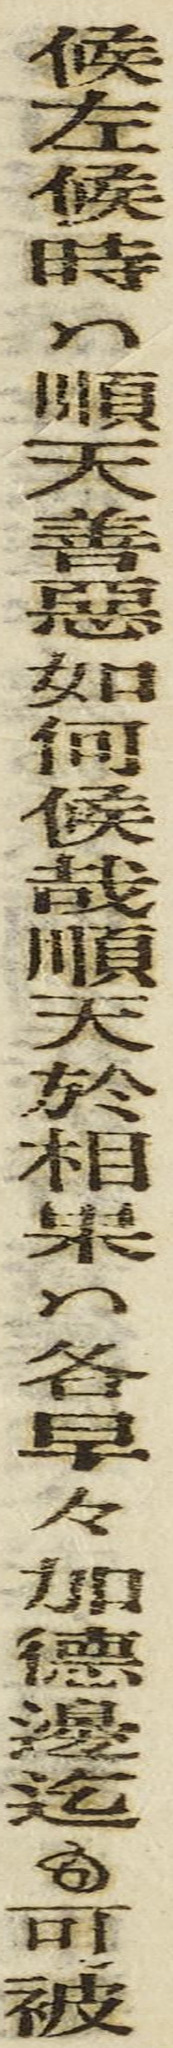候左候時ハ順天善悪如何候哉順天於相果ハ各早々加徳辺迄も可被
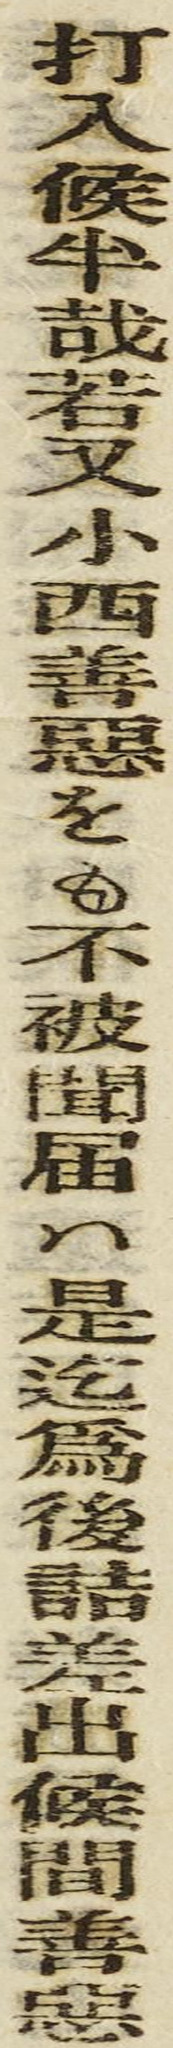打入候半哉若又小西善悪をも不被聞届ハ是迄為後詰差出候間善悪
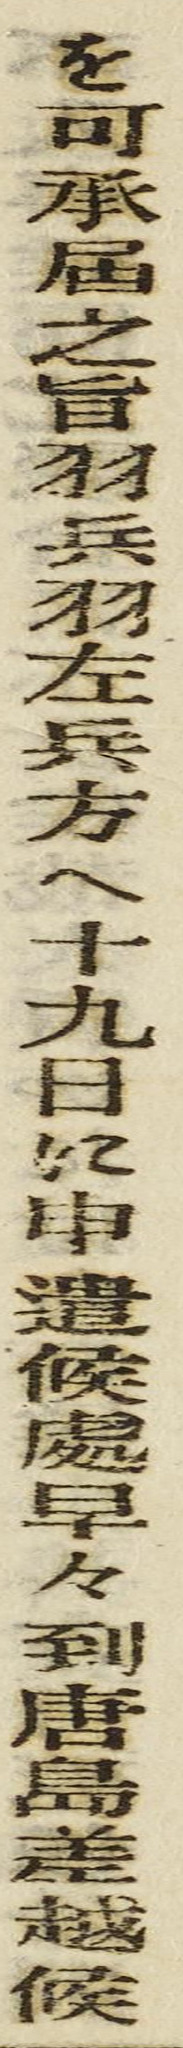を可承届之旨羽兵羽左兵方へ十九日に申遣候処早々到唐島差越候
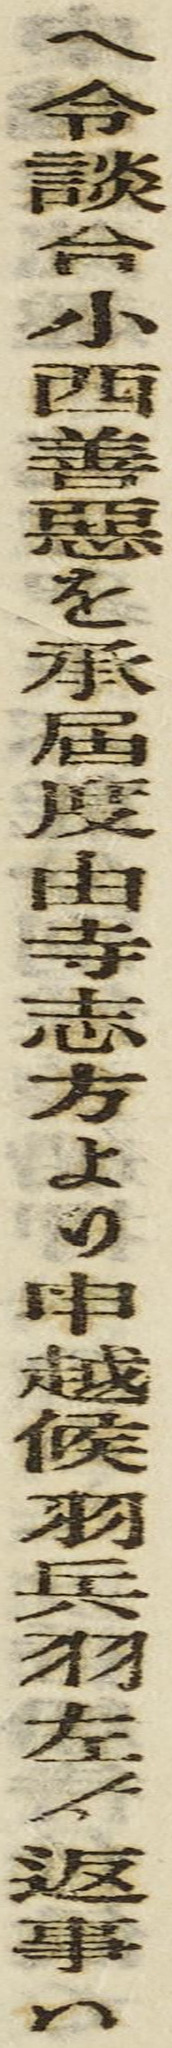へ令談合小西善悪を承届度由寺志方より申越候羽兵羽左ゟ返事ハ
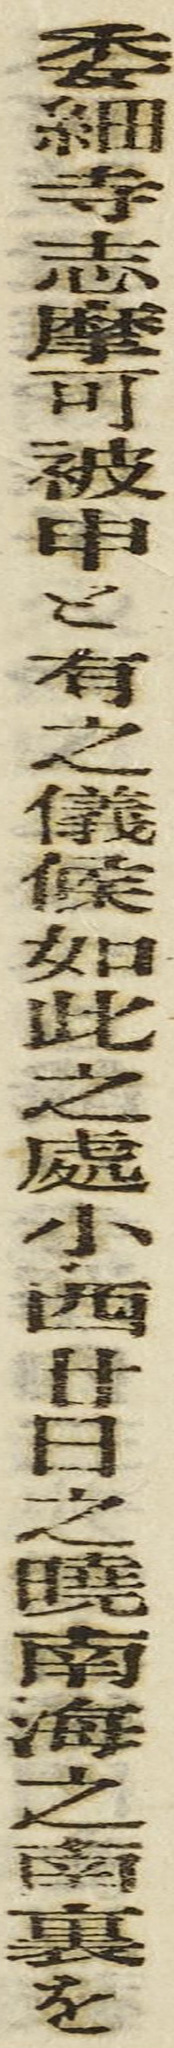委細寺志摩可被申と有之儀候如此之処小西廿日之暁南海之南裏を
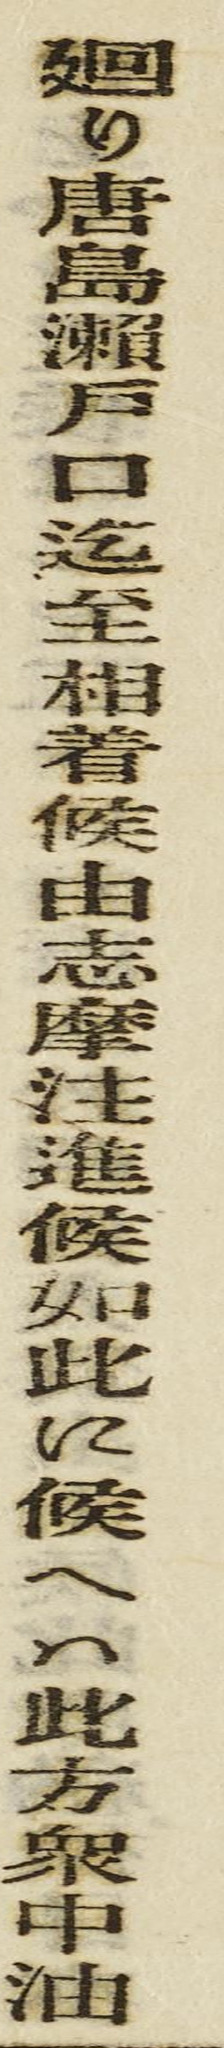廻り唐島瀬戸口迄至相着候由志摩注進候如此に候へハ此方衆中油
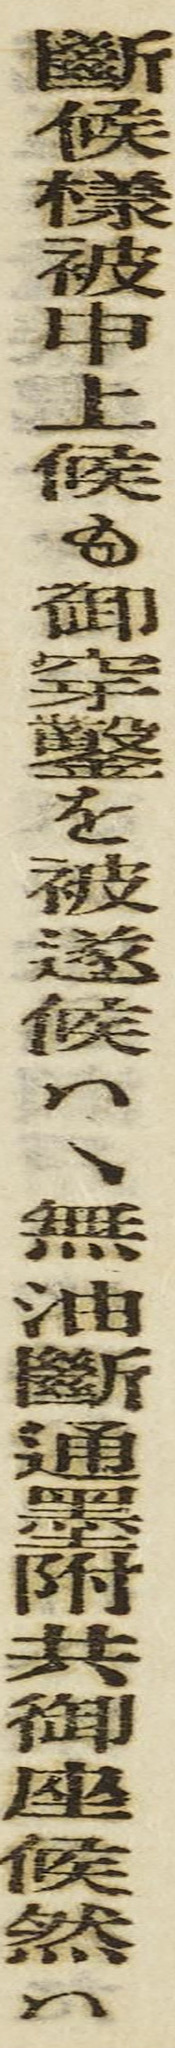断候樣被申上候も御穿鑿を被遂候ハヽ無油断通墨付共御座候然ハ
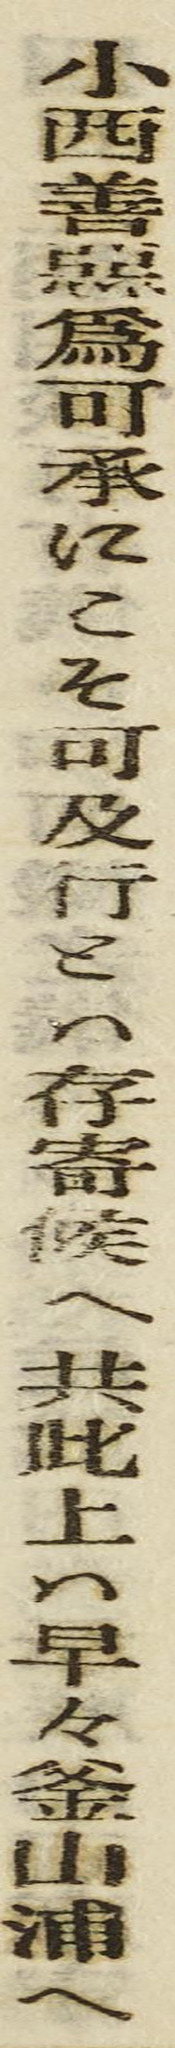小西善悪為可承にこそ可及行とハ存寄候へ共此上ハ早々釜山浦へ
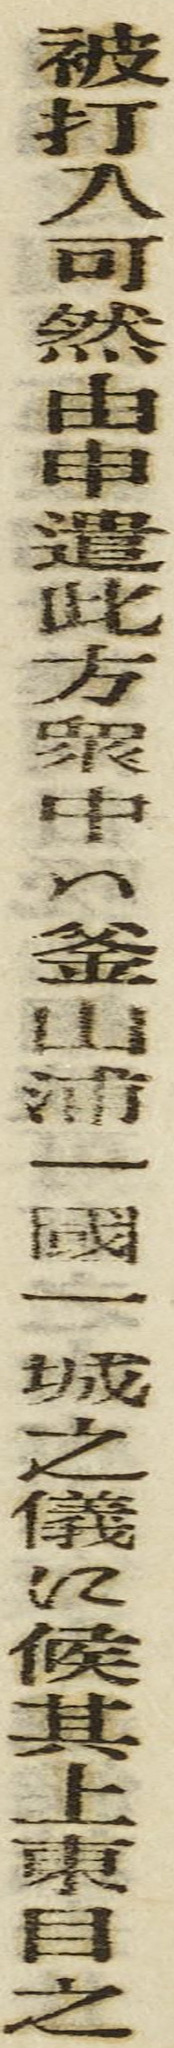被打入可然由申遣此方衆中ハ釜山浦一国一城之儀に候其上東目之
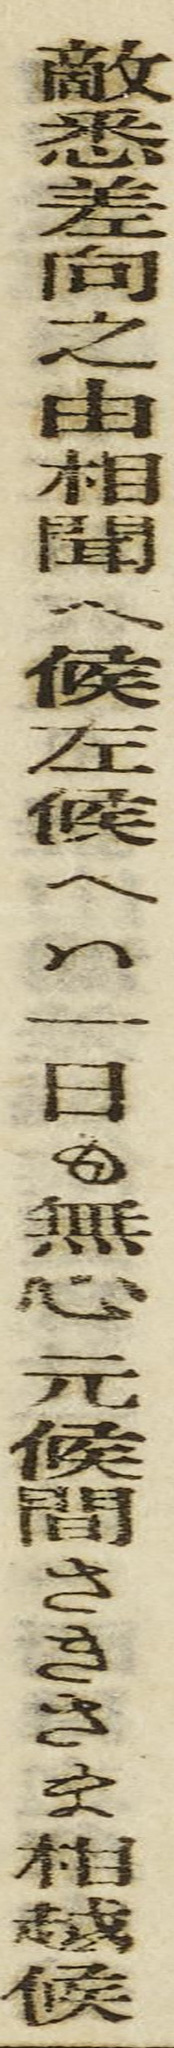敵悉差向之由相聞へ候左候へハ一日も無心元候間さきさま相越候

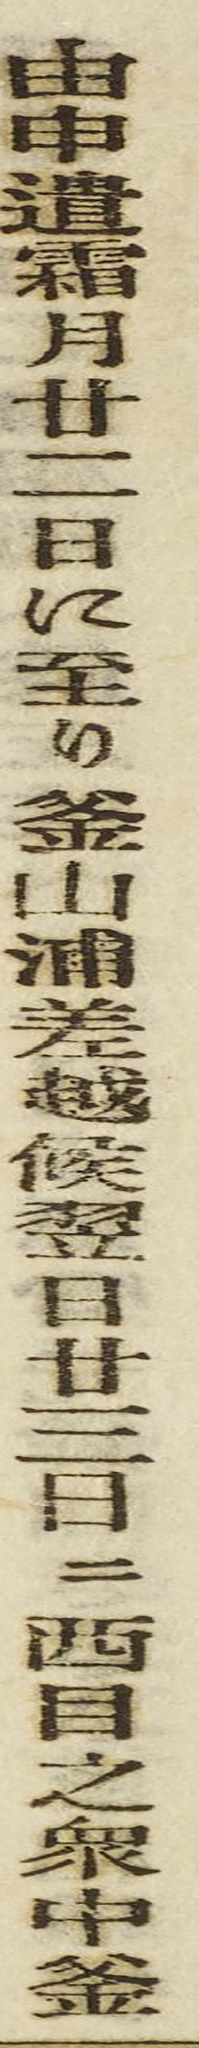由申遣霜月廿二日に至り釜山浦差越候翌日廿三日ニ西目之衆中釜
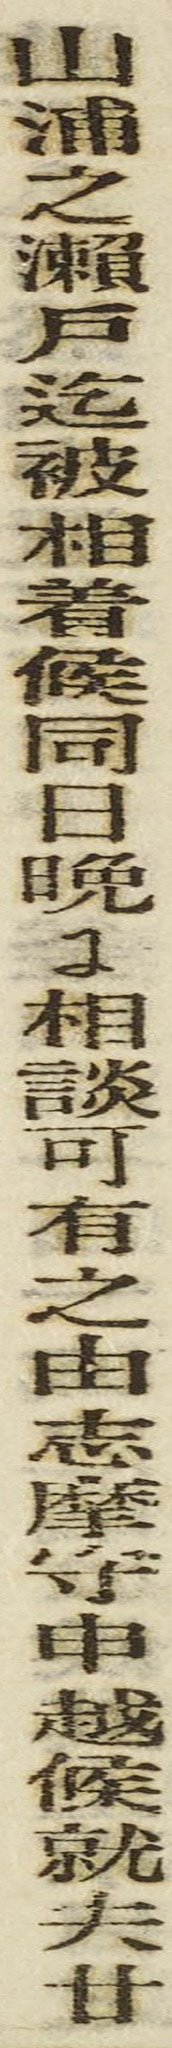山浦之瀬戸迄被相着候同日晩に相談可有之由志摩守申越候就夫廿
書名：史籍集覽　朝鮮陣古文・細井廣澤記・颶風紀事・天明七年將軍宣下次第書　全
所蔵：東京大学地震研究所図書室 Earthquake Research Institute Library, The University of Tokyo, JAPAN
